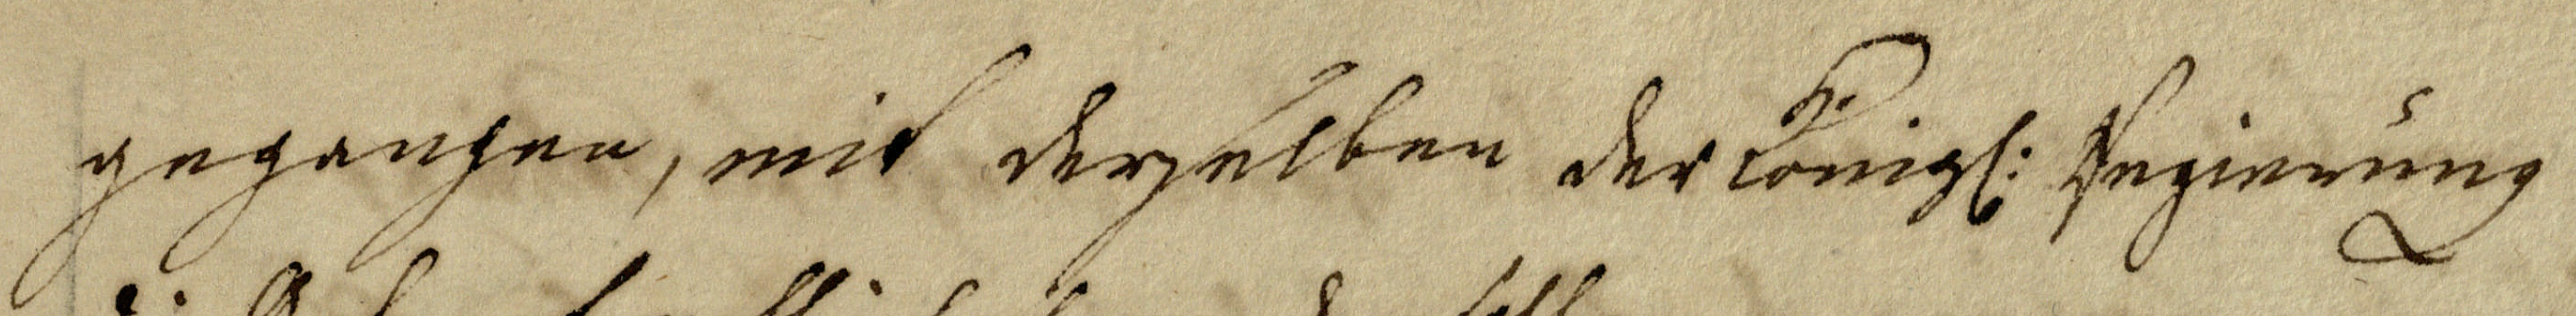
gegangen, mit derselben der Königl. Regierung
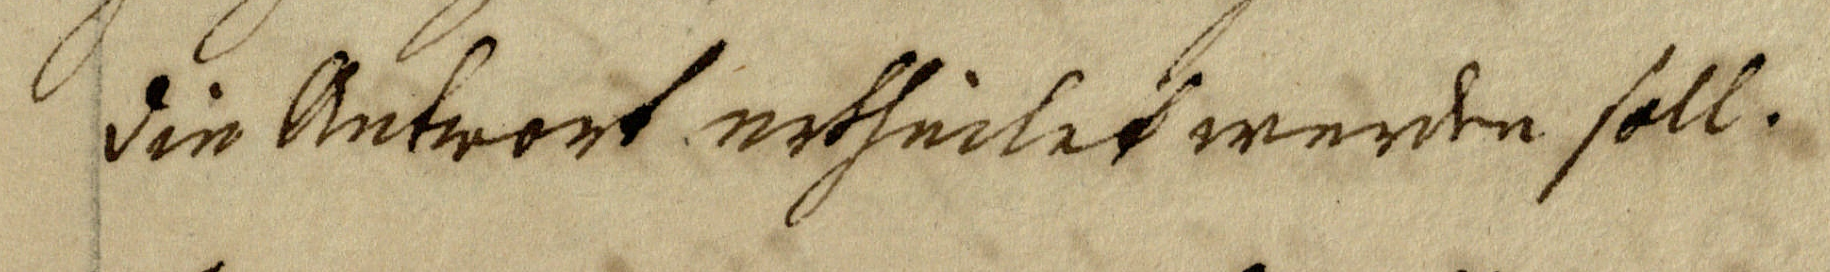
die Antwort ertheilet werden soll.
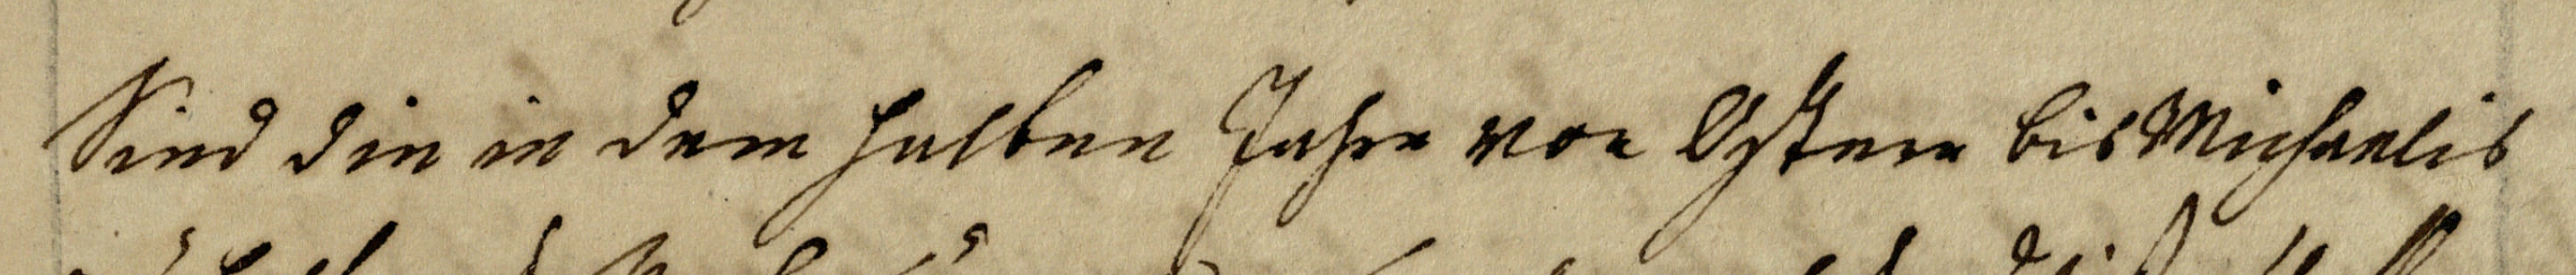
Sind die in dem halben Jahre von Ostern bis Michaelis
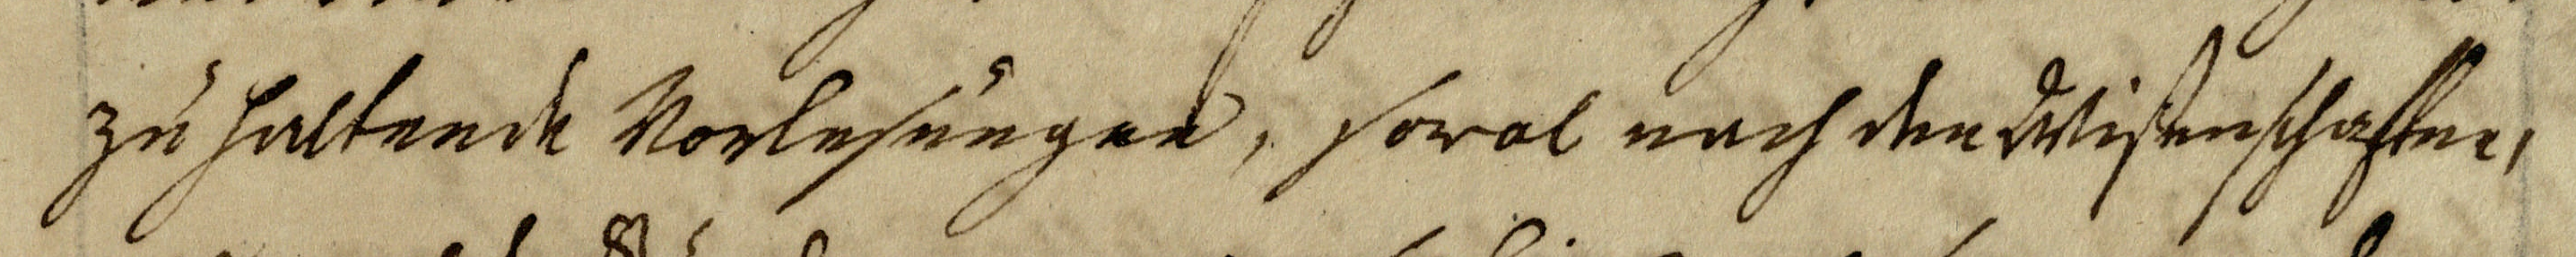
zu haltende Vorlesungen, sowol nach den Wissenschaften,
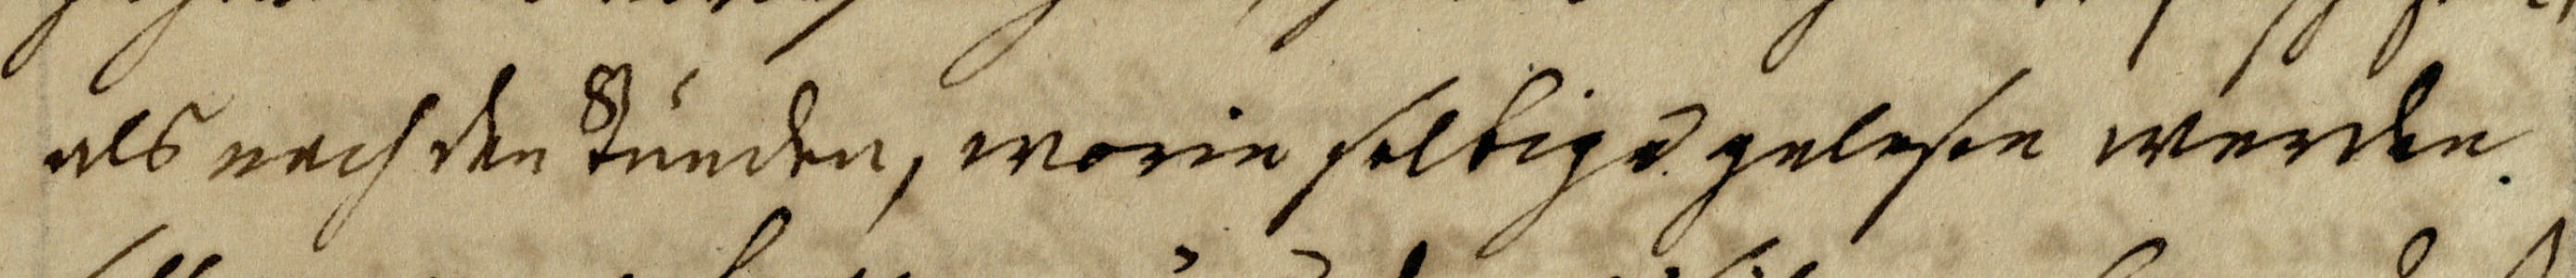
als nach den Stunden, worin selbige gelesen werden
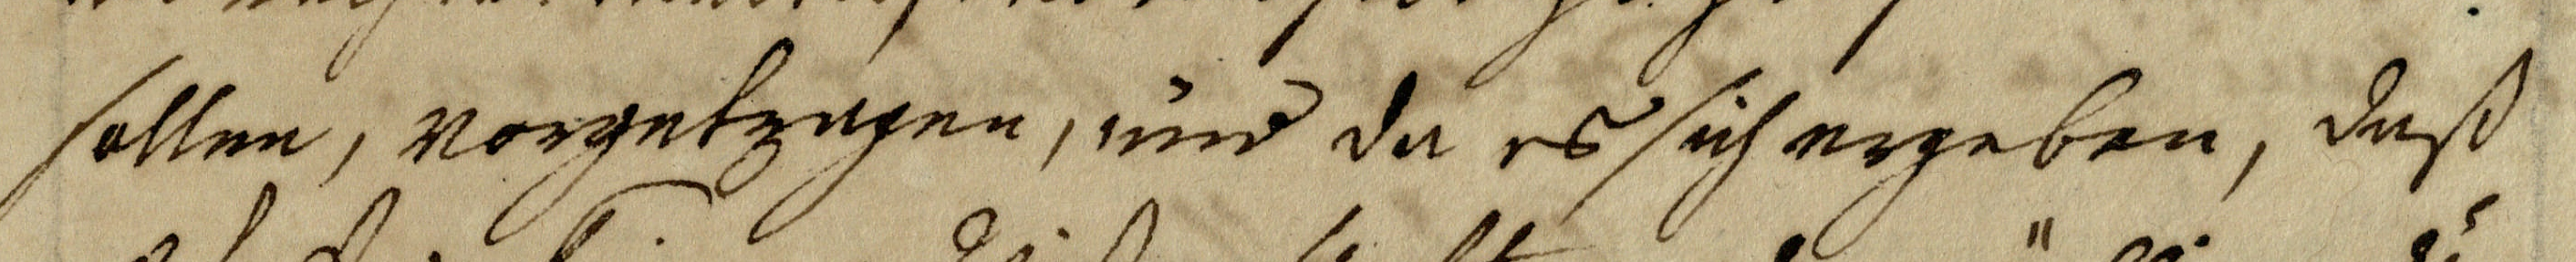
sollen, vorgetragen, und da es sich ergeben, daß
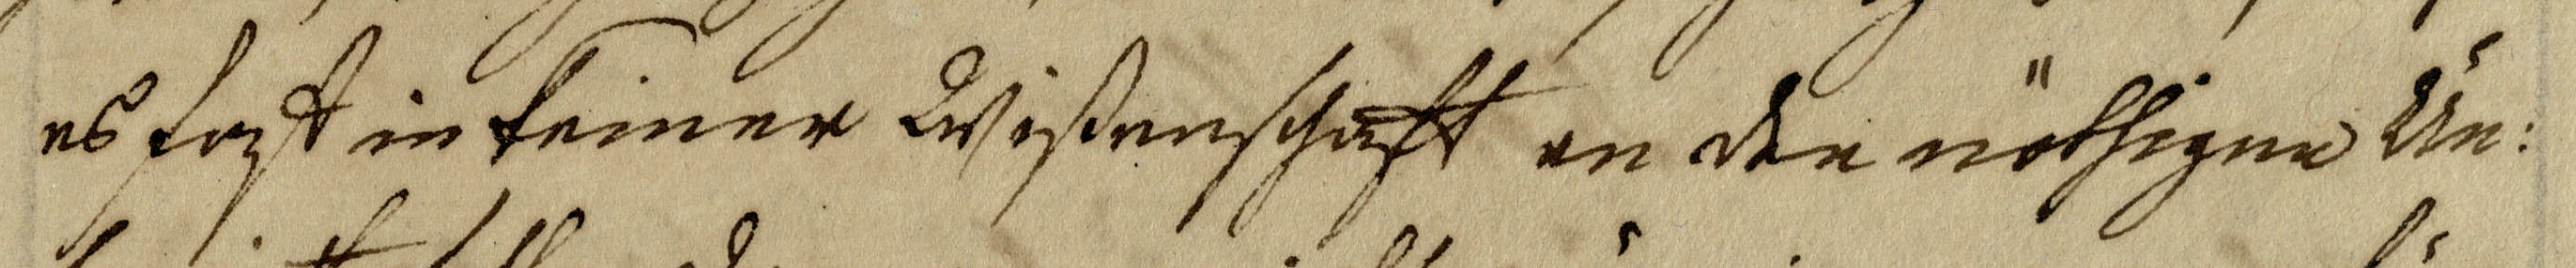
es sonst in keiner Wissenschaft an den nöthigen Un¬
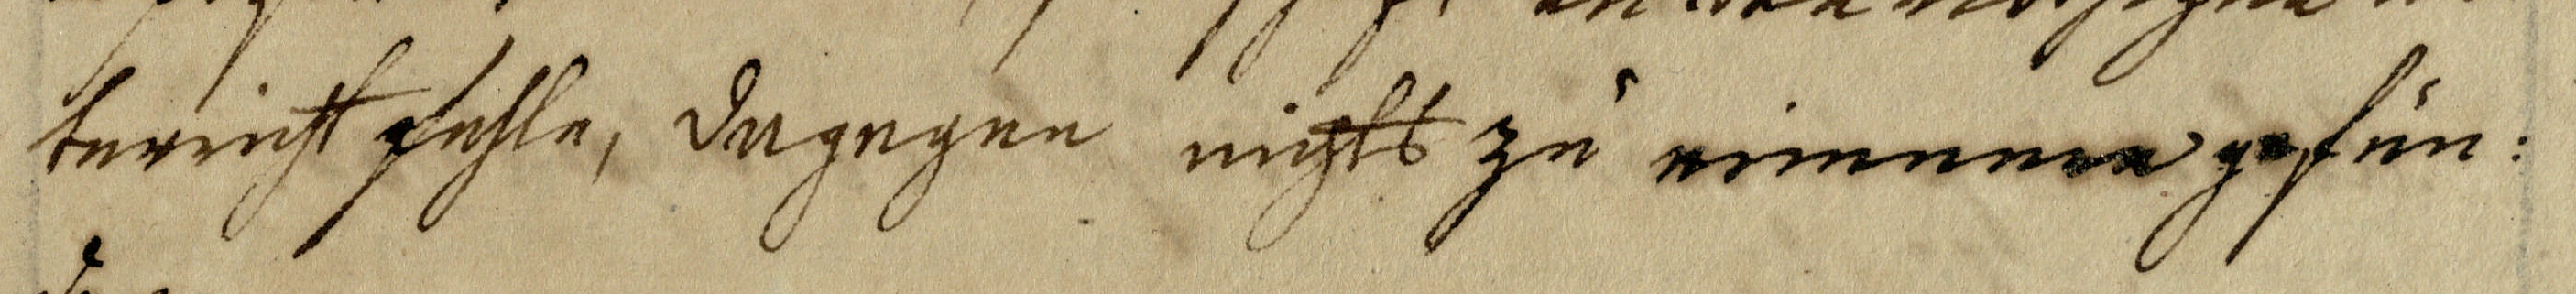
terricht fehle, dagegen nichts zu erinnern gefun¬
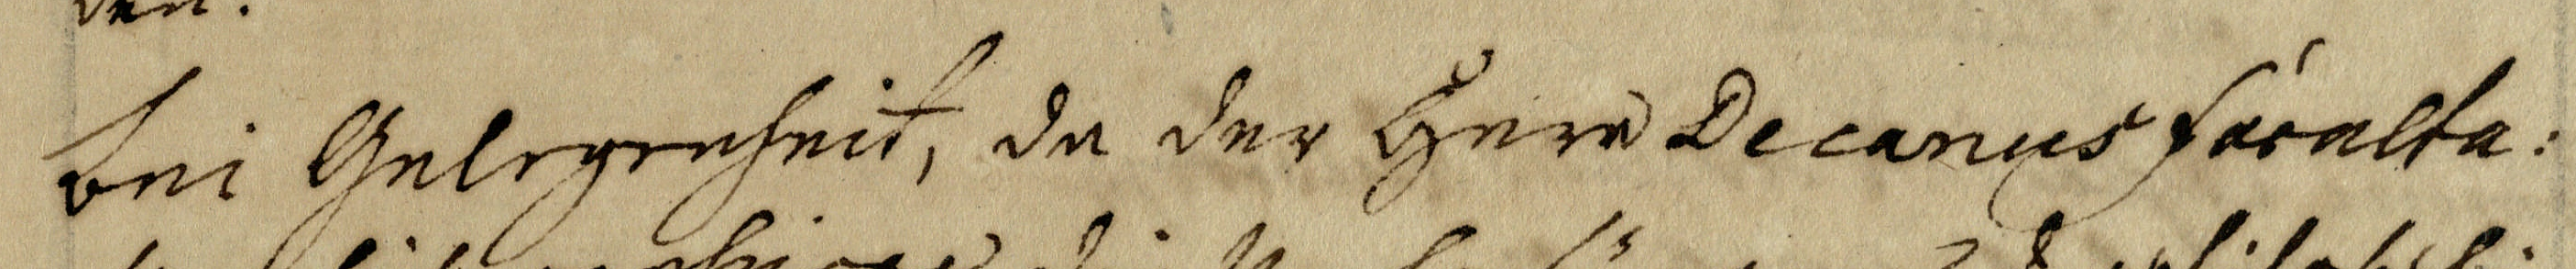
Bei Gelegenheit, da der Herr Decanus Faculta¬
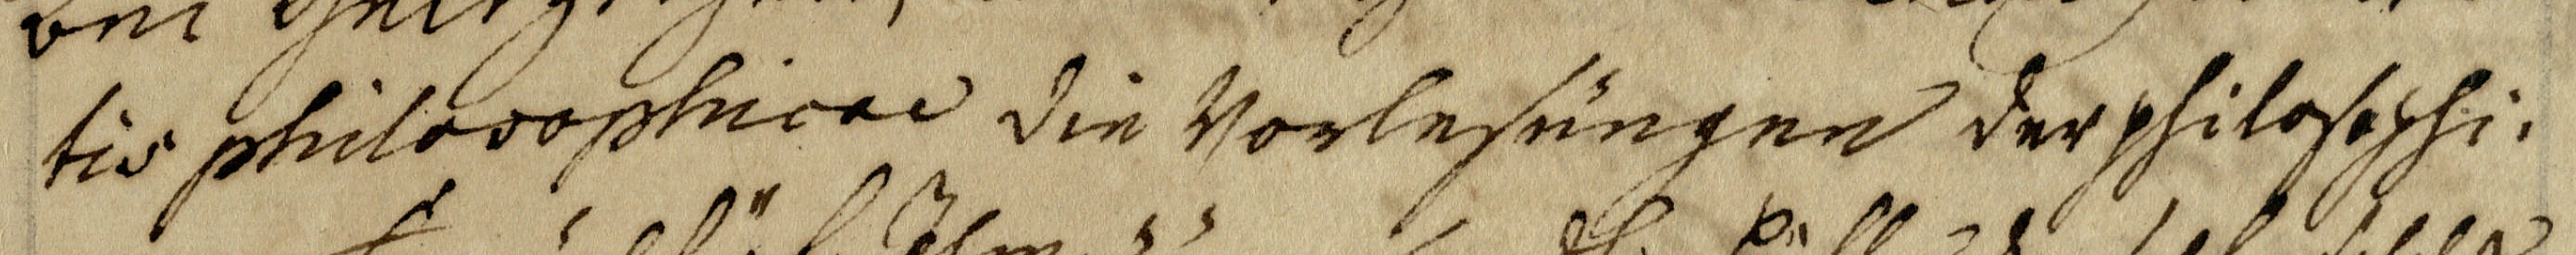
tis philosophicae die Vorlesungen der philosophi¬
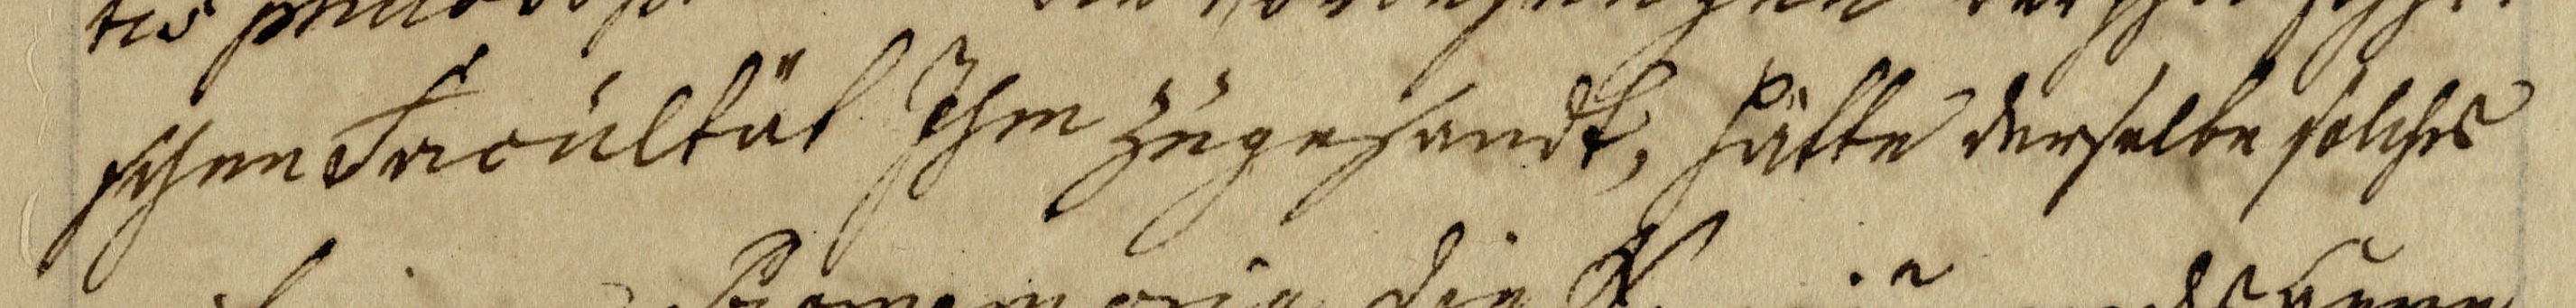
schen Facultät Ihm zugesandt, hätte derselbe solches
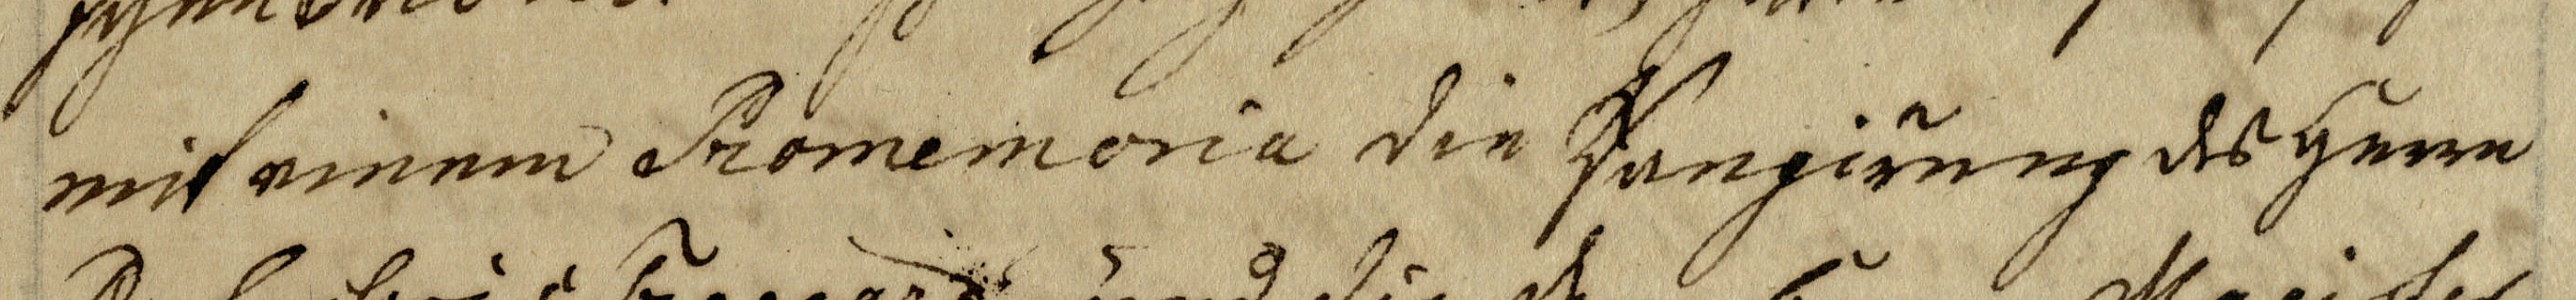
mit einem Promemoria die Rangirung des Herrn
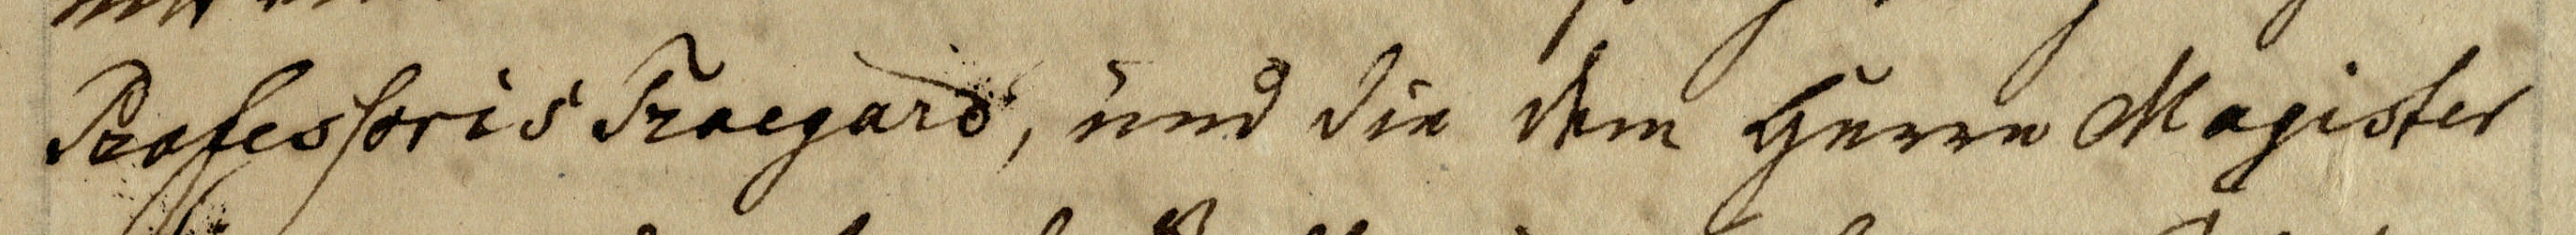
Professoris Traegard, und die dem Herrn Magister
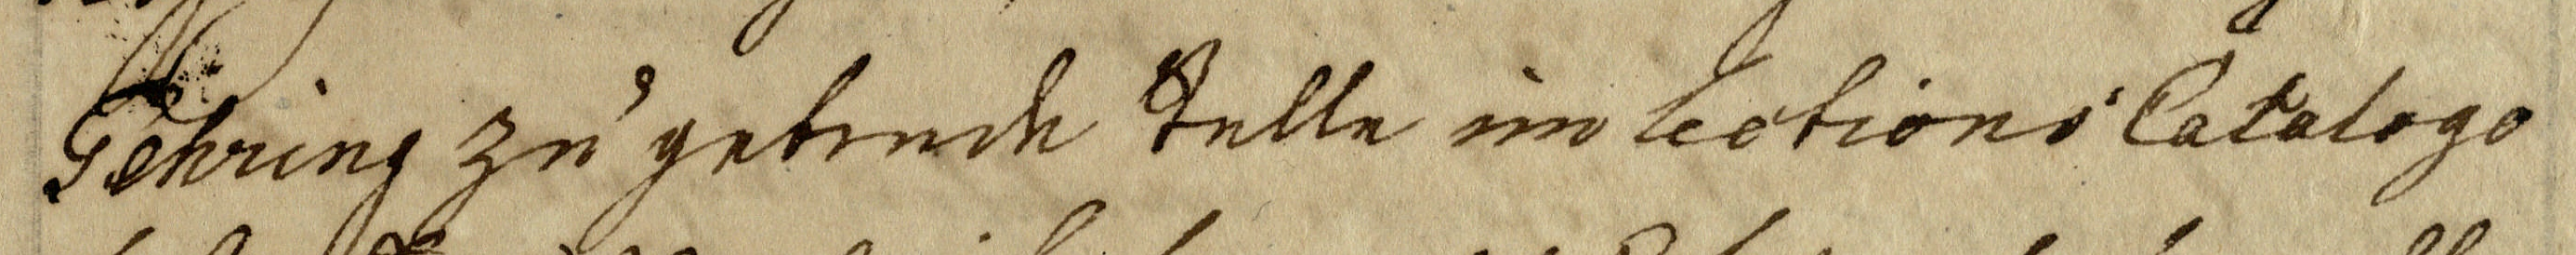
Gehring zu gebende Stelle im Lections Catalogo
